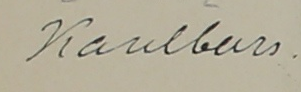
Kaulbars
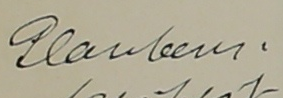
Glaubens-
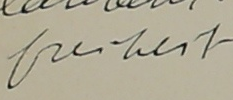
freiheit
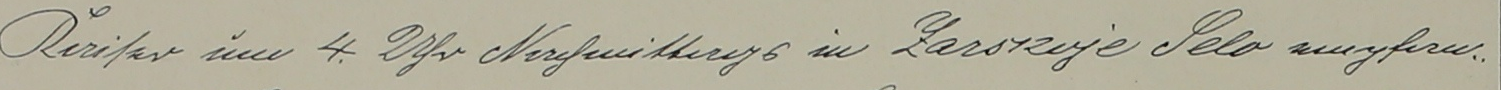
Kaiser um 4. Uhr nachmittags in Zarskoje Selo empfan-
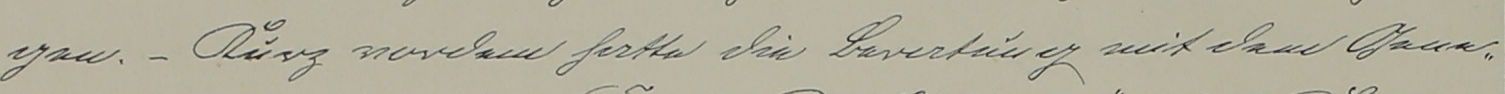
gen. – Kurz vordem hatte die Beratung mit dem Gene-
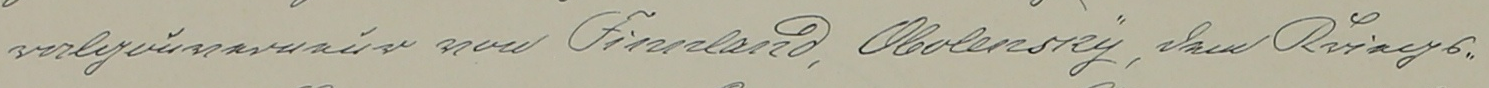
ralgouverneur von Finnland, Obolensky, dem Kriegs-
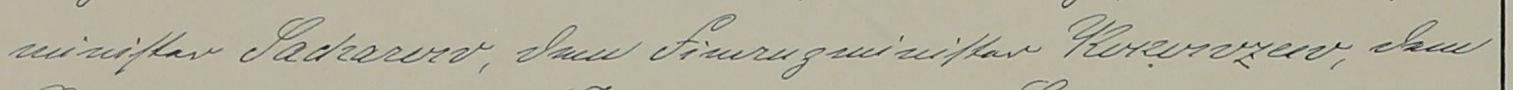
minister Sacharow, dem Finanzminister Kokowzew, dem
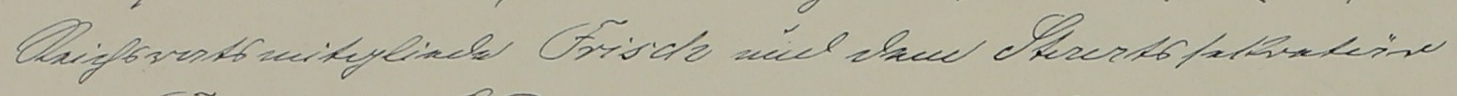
Reichsratsmitgliede Frisch und dem Staatssekretär
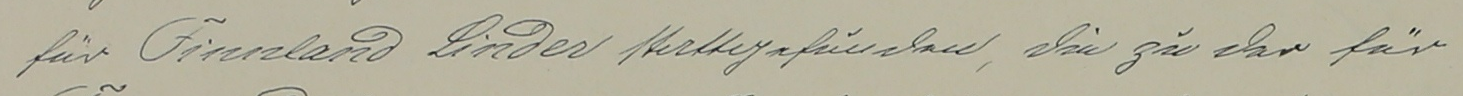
für Finnland Linder stattgefunden, die zu der für
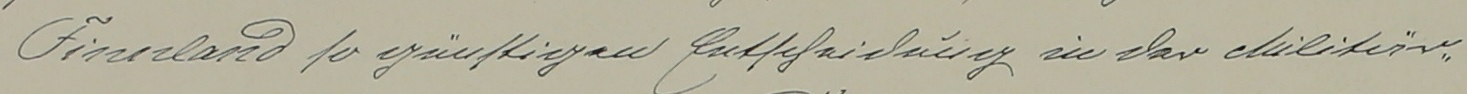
Finnland so günstigen Entscheidung in der Militär-
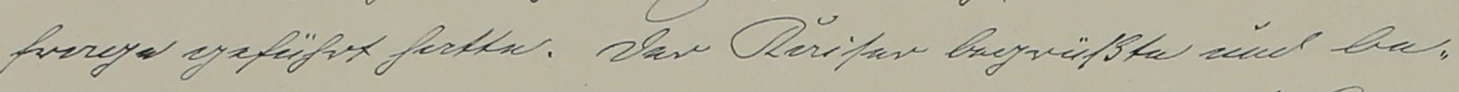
frage geführt hatte. Der Kaiser begrüßte und be-
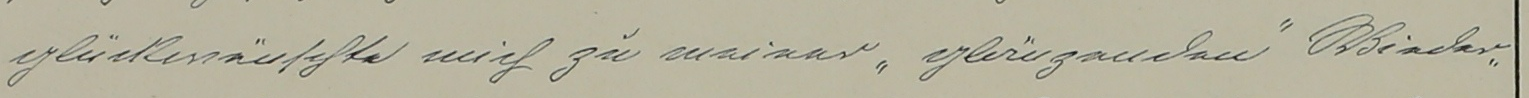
glückwünschte mich zu meiner „glänzenden“ Wieder-
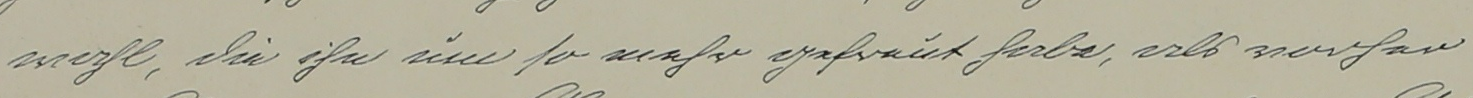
wahl, die ihn um so mehr gefreut habe, als vorher
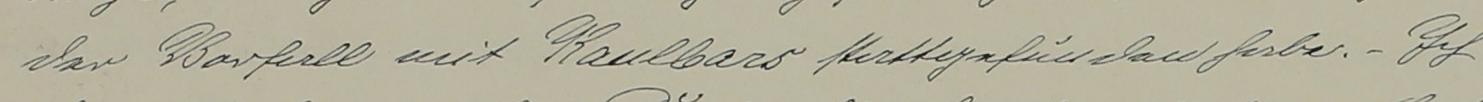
der Vorfall mit Kaulbars stattgefunden habe. – Ich
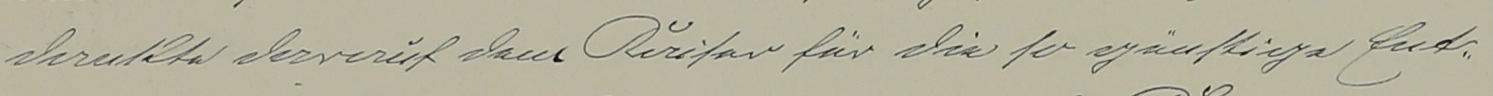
dankte darauf dem Kaiser für die so günstige Ent-
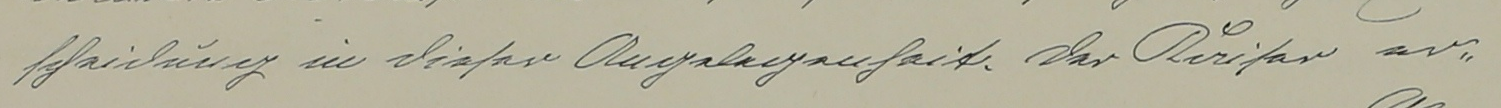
scheidung in dieser Angelegenheit. Der Kaiser er-
